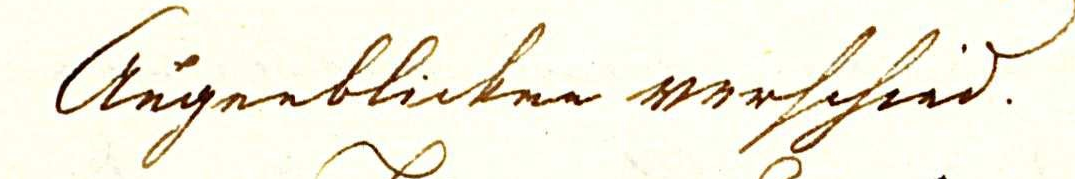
Augenblicken verschied.
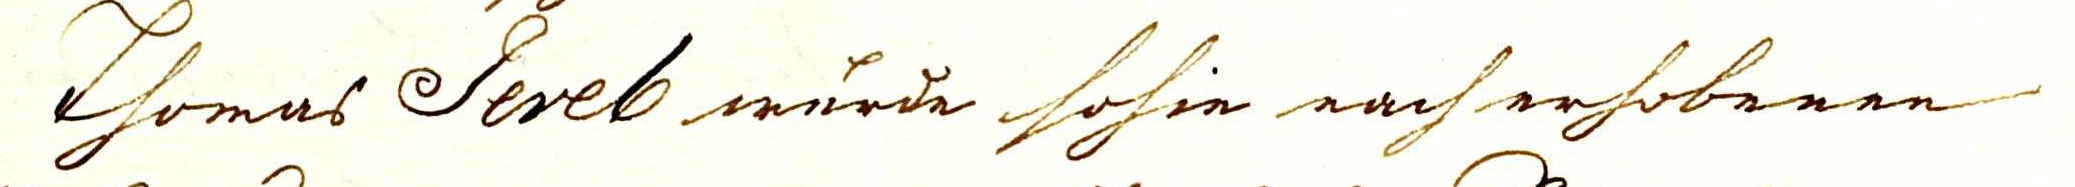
Thomas Jereb wurde sohin nach erhobenen
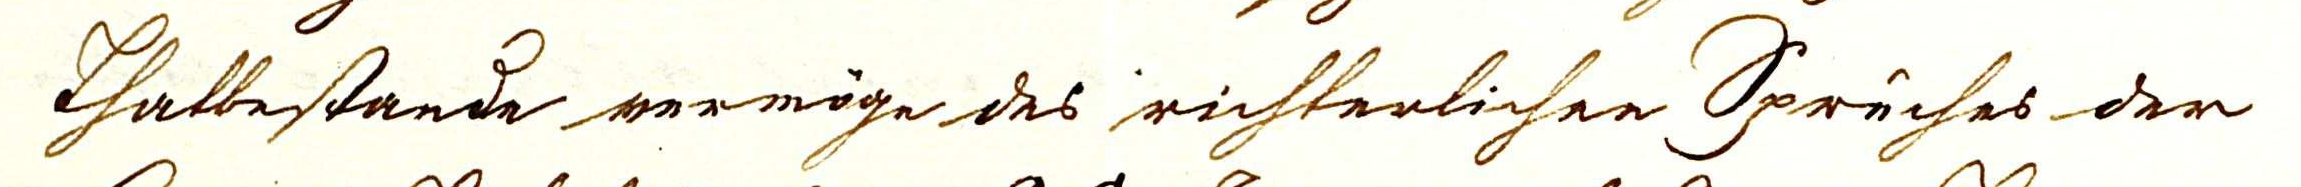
Thatbestande vermöge des richterlichen Spruches der
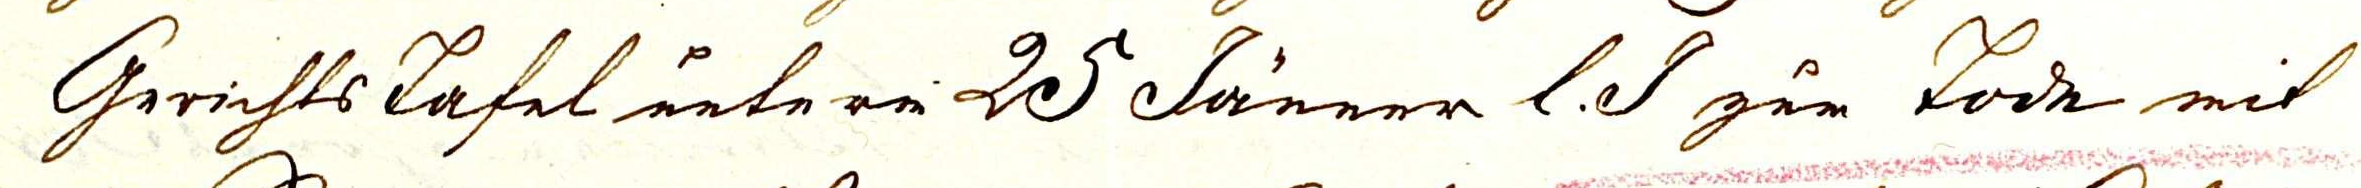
Gerichts Tafel unterm 25 Jänner l. J. zum Tode mit
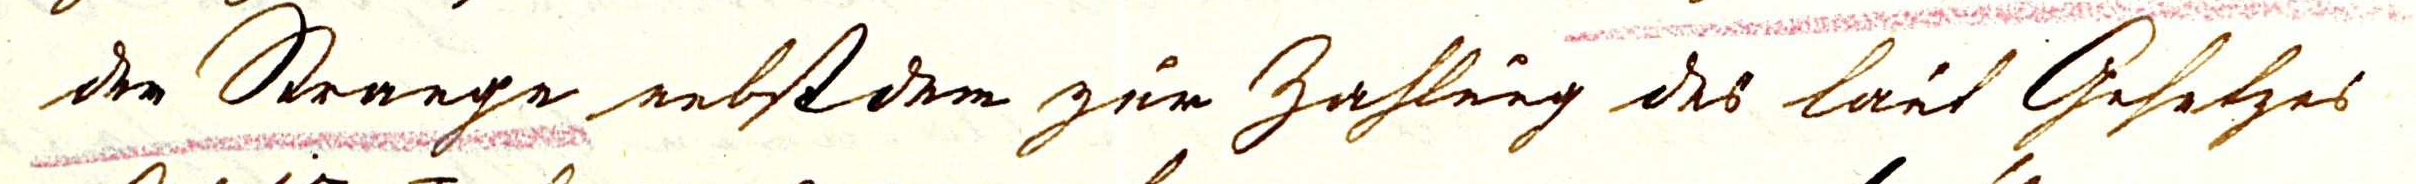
dem Strange nebstdem zur Zahlung des laut Gesetzes
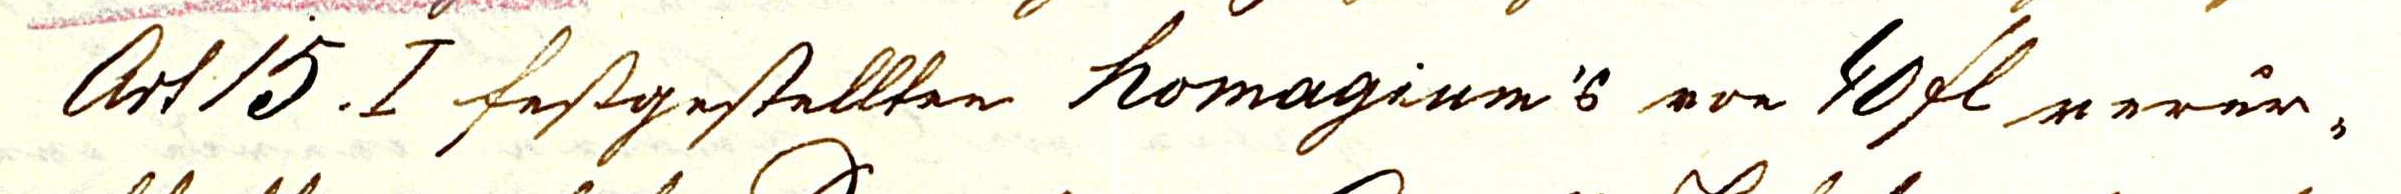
Art 15. I festgestellten Homagium’s von 40fl verur¬
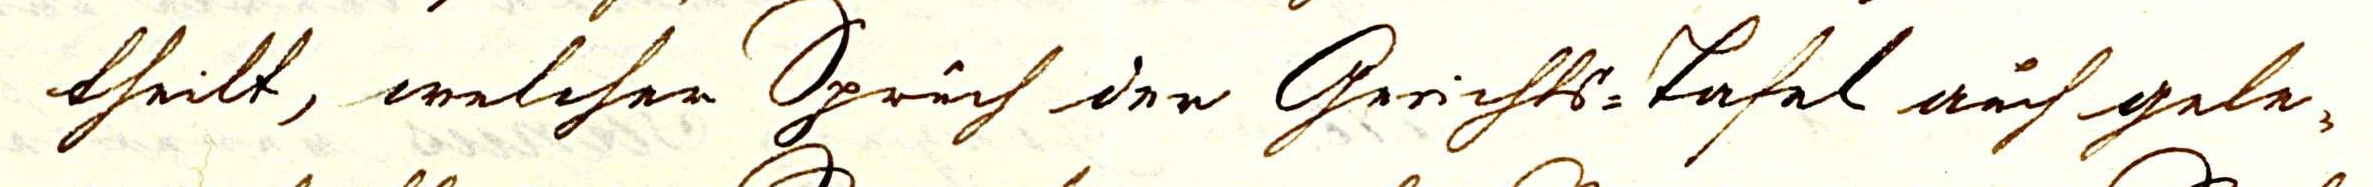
theilt, welcher Spruch der Gerichts-Tafel auch gele¬
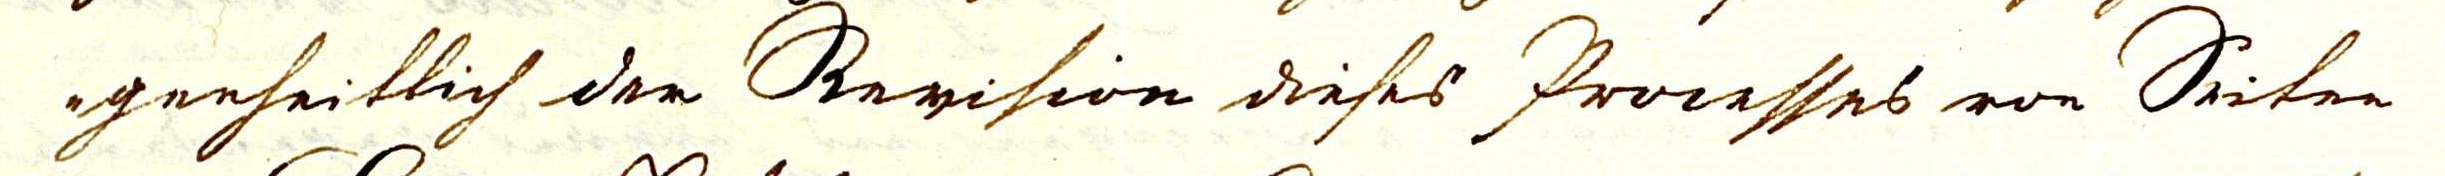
genheitlich der Revision dieses Processes von Seiten
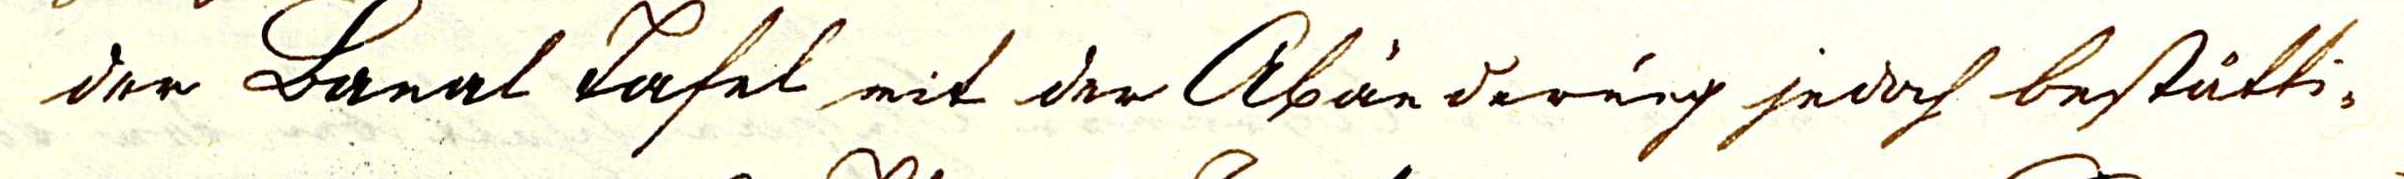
der Banal Tafel mit der Abänderung jedoch bestätti¬
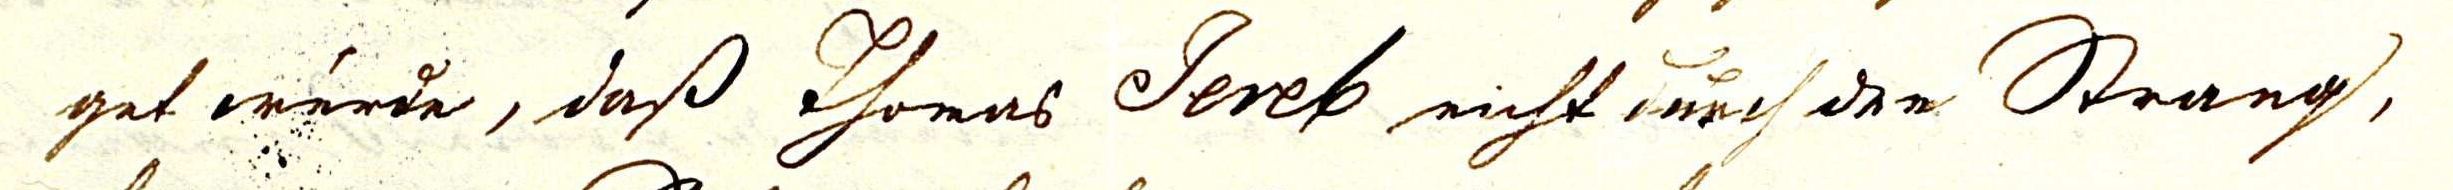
get wurde, daß Thomas Jereb nicht durch den Strang,
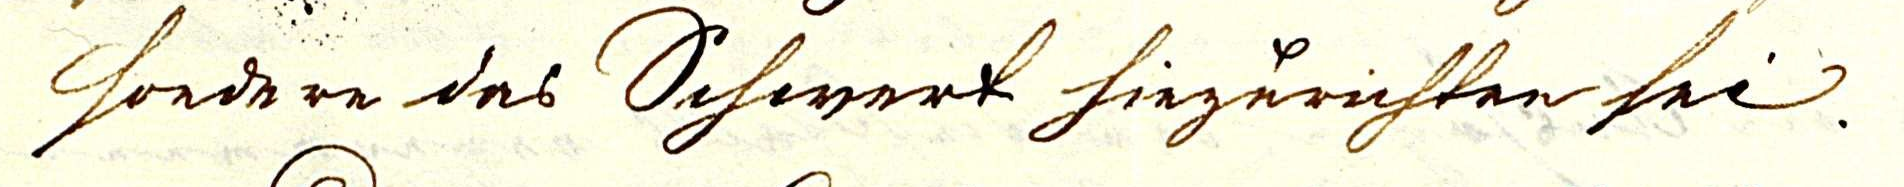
sondern das Schwert hinzurichten sei.
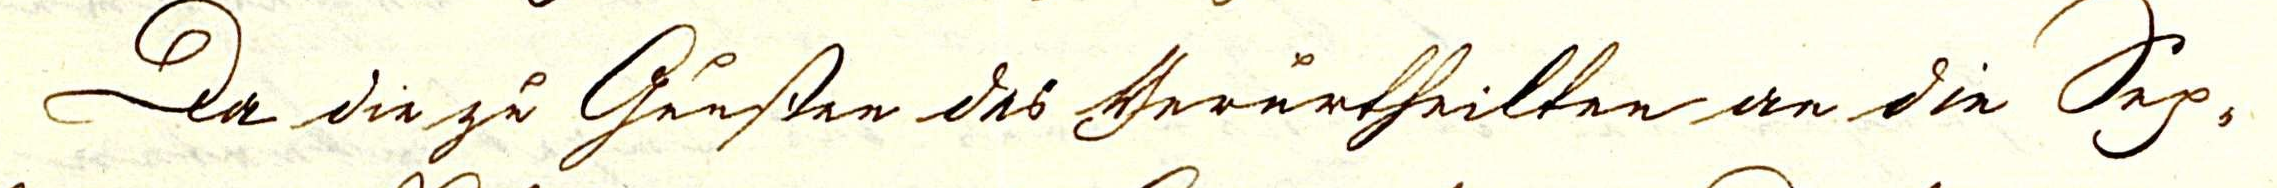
Da die zu Gunsten des Verurtheilten an die Sep¬
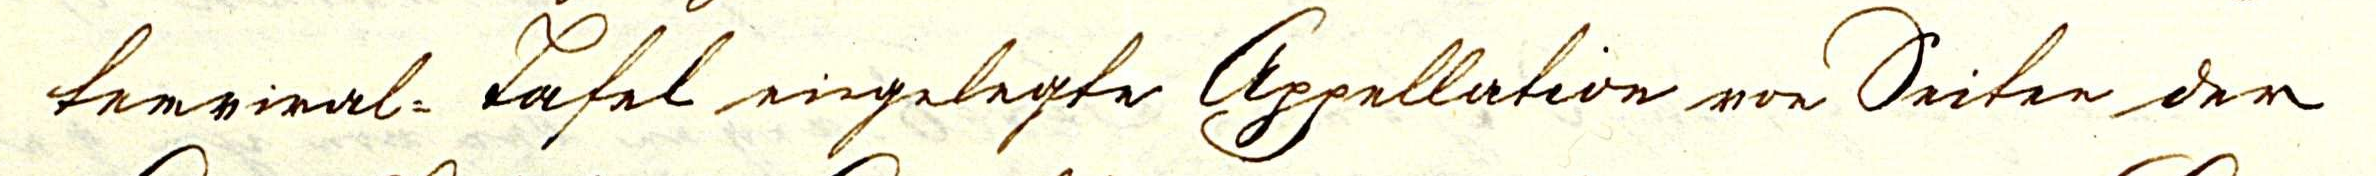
temviral-Tafel eingelegte Appellation von Seiten der
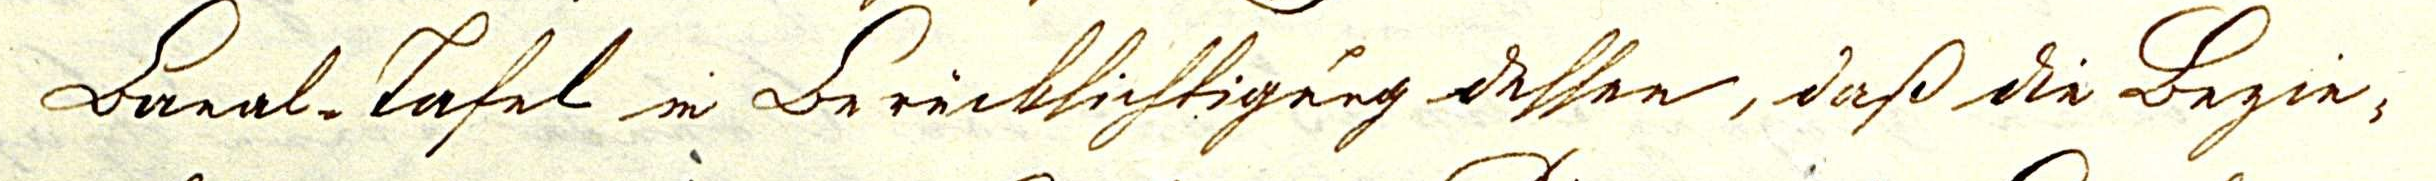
Banal-Tafel in Berücksichtigung dessen, daß die Bezie¬
